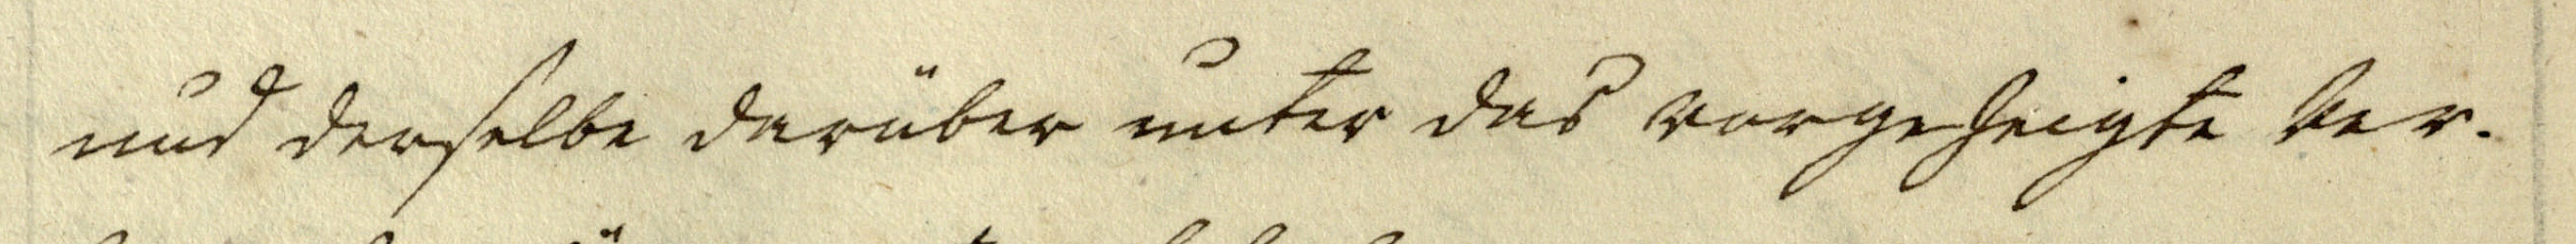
und derselbe darüber unter das vorgezeigte Ver¬
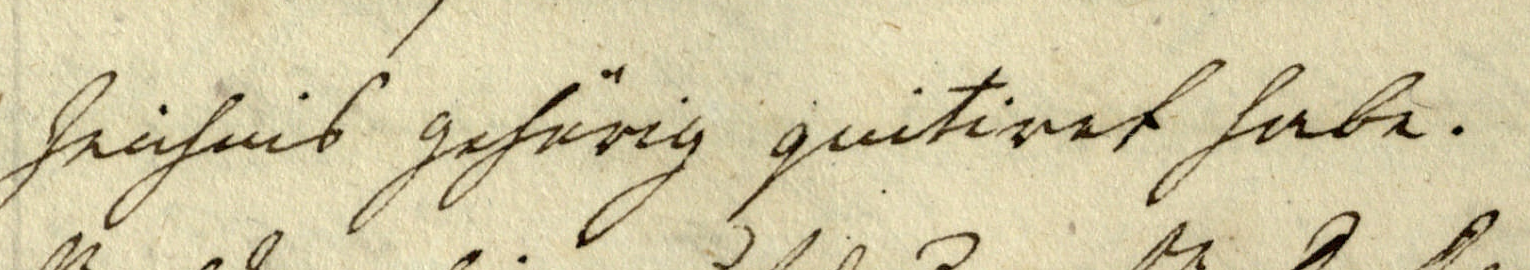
zeichnis gehörig quitiret habe.
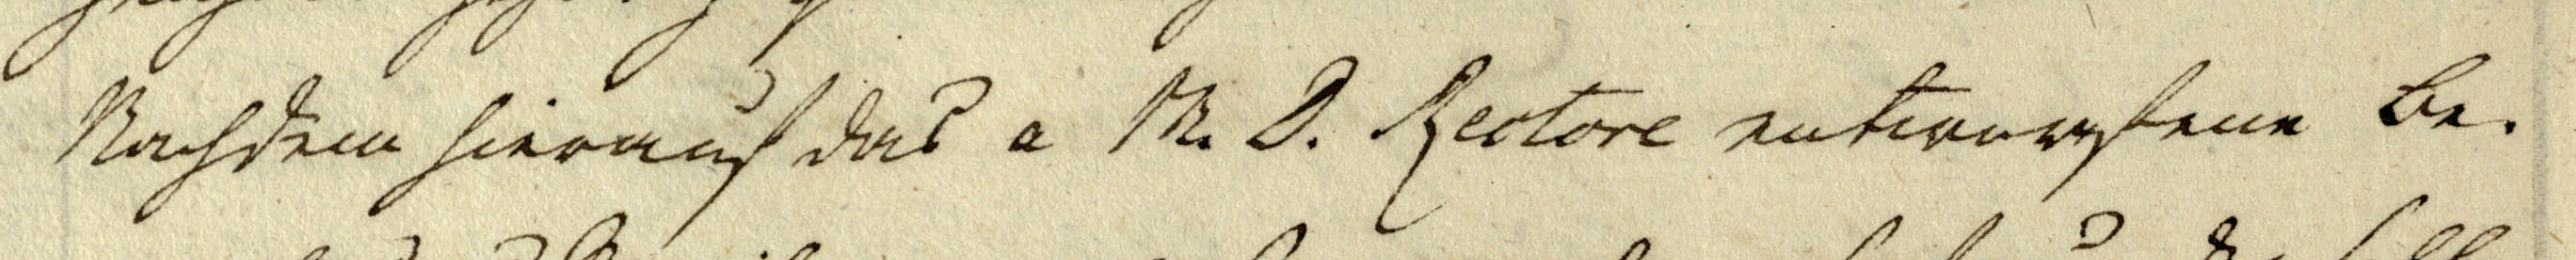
Nachdem hierauf das a M. D. Rectore entworfene Be¬
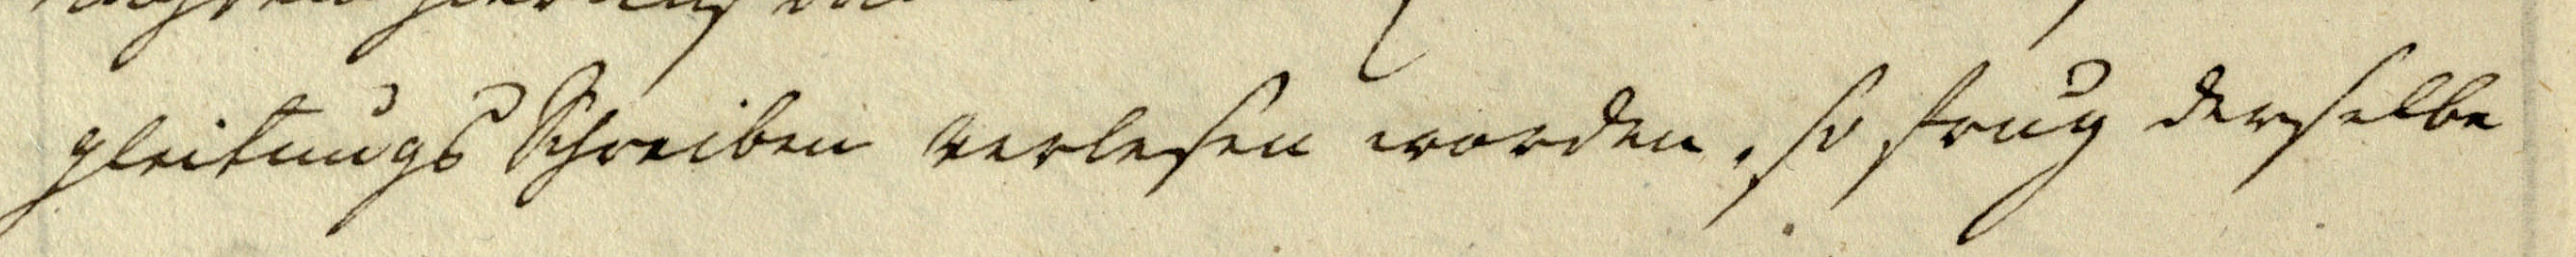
gleitungs Schreiben verlesen worden, so frug derselbe
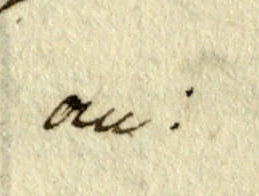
an:
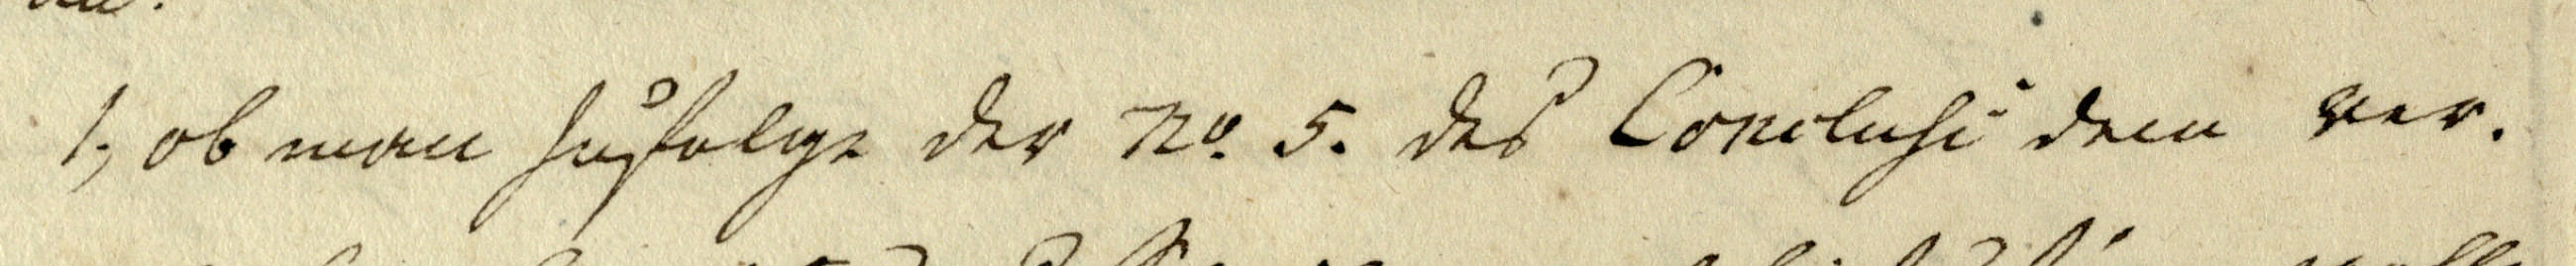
1., ob man zufolge der No. 5. des Conclusi dem ver¬
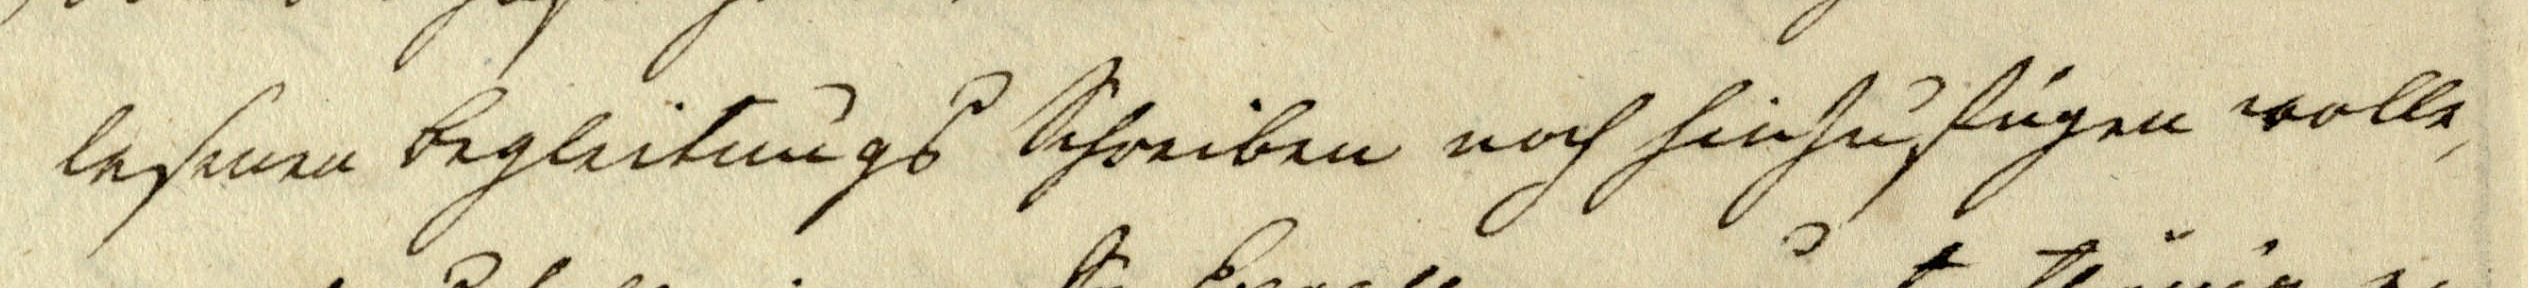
lesenen Begleitungs Schreiben noch hinzufügen wolle,
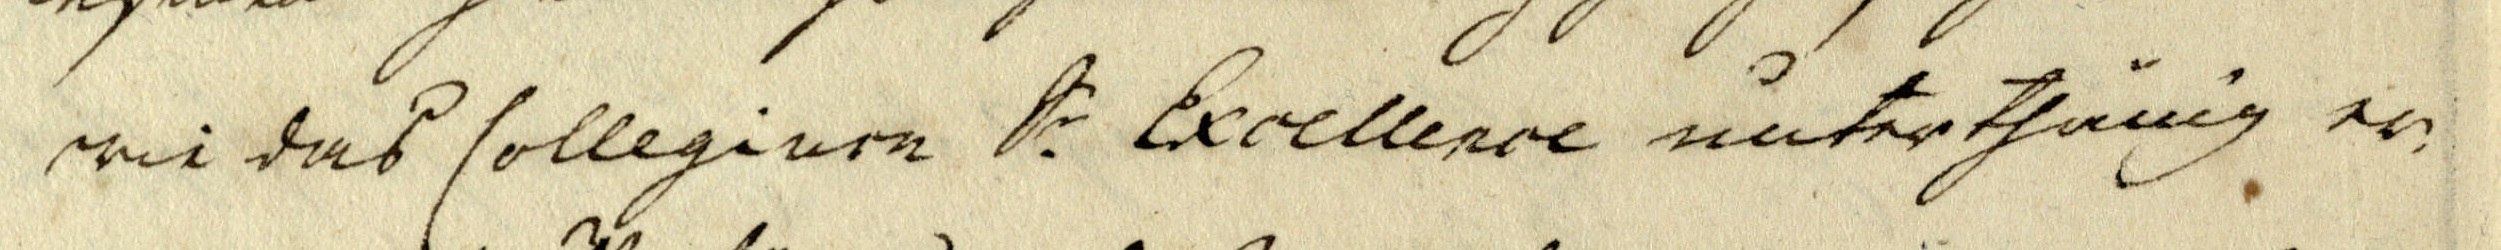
wie das Collegium Sr Excellence unterthänig er¬
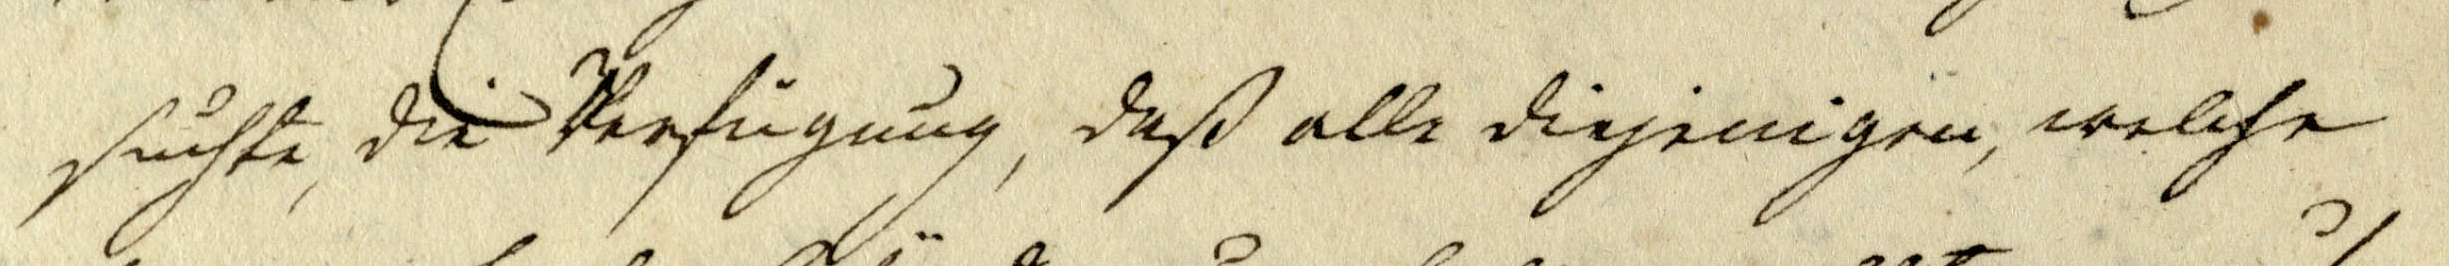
suchte, die Verfügung, daß alle diejenigen, welche
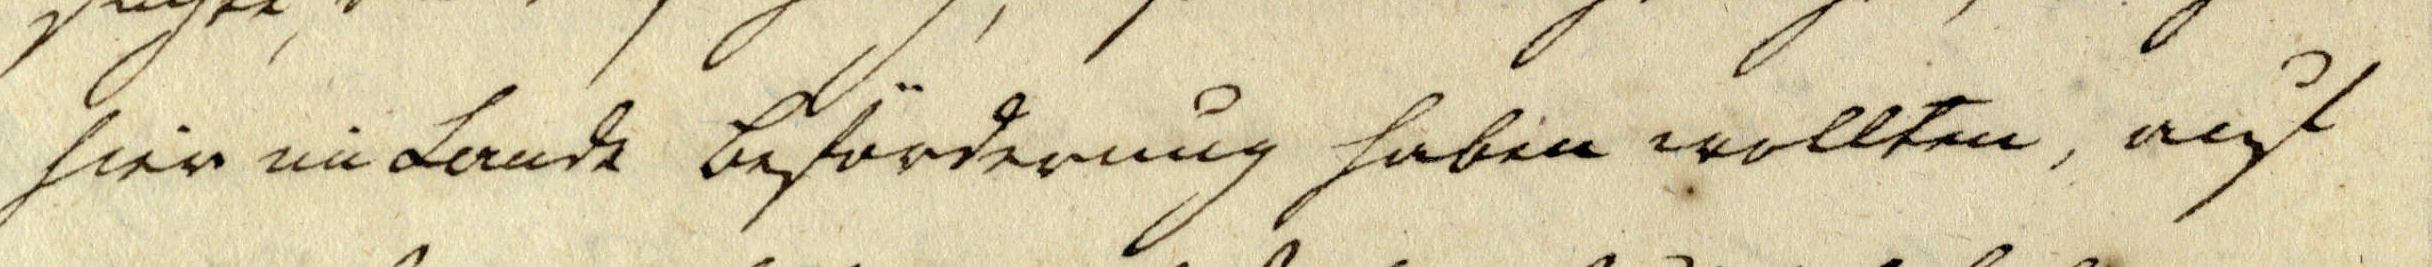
hier im Lande Beförderung haben wollten, auf
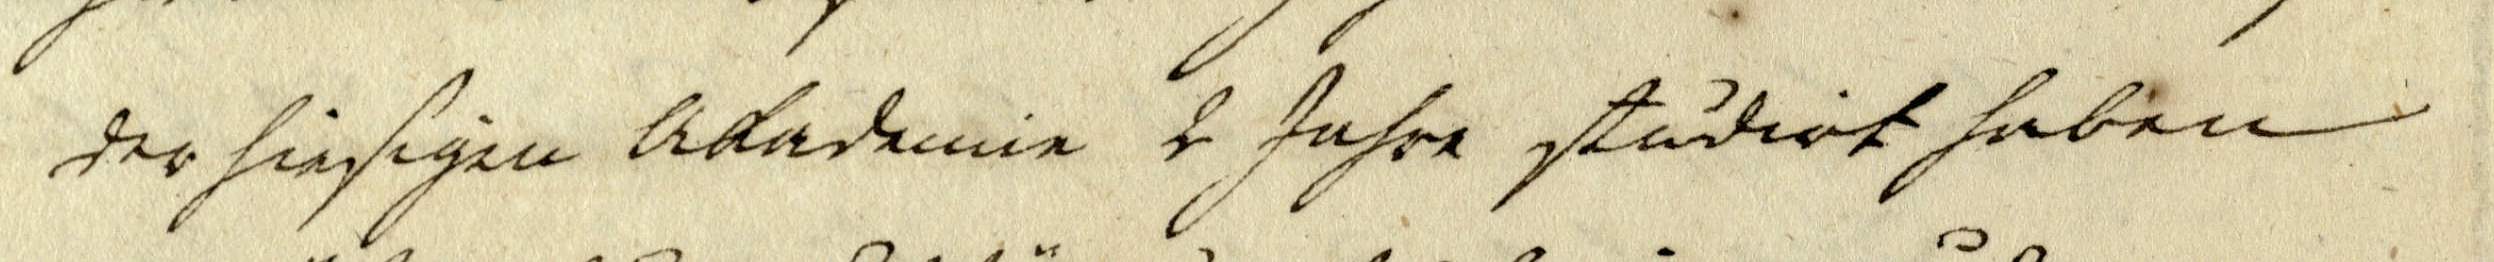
der hiesigen Akademie 2 Jahre studirt haben
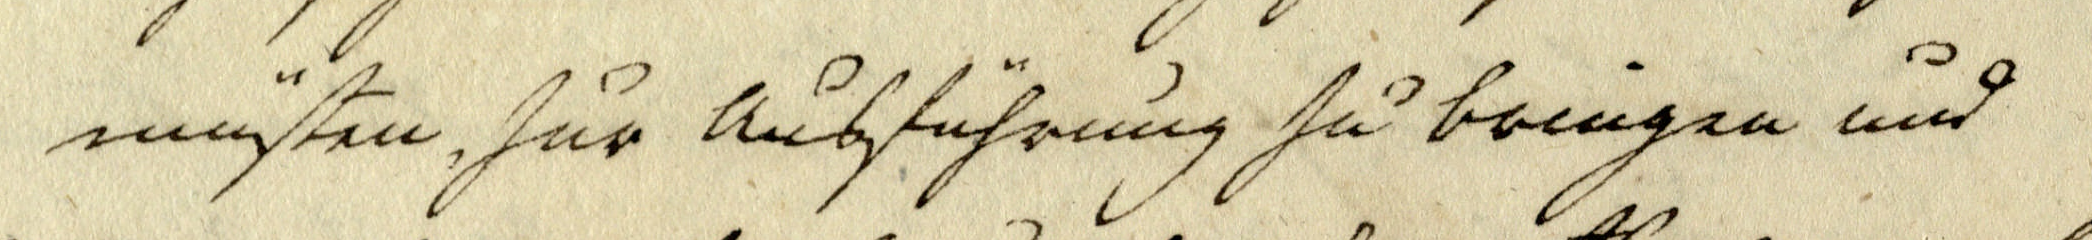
müßten, zur Ausführung zu bringen und
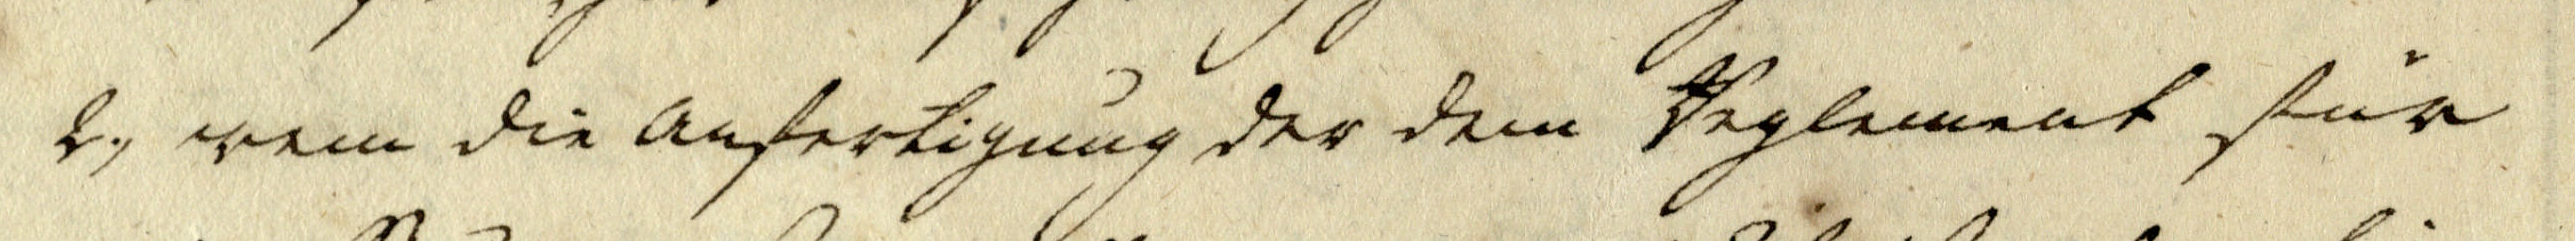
2., wem die Anfertigung der dem Reglement für
